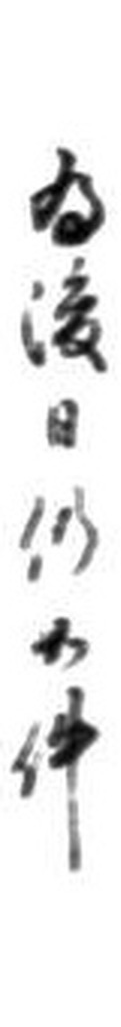為後日仍如件
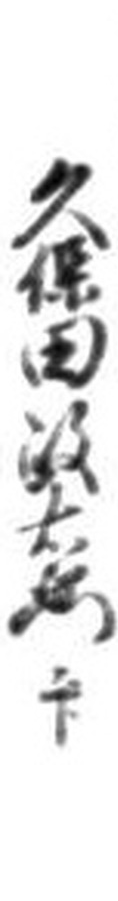久保田政右衛門印
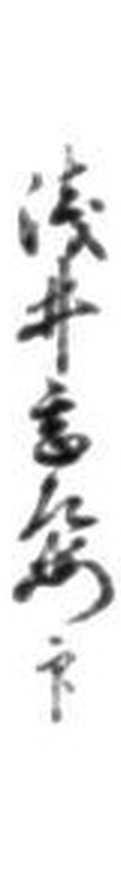浅井甚左衛門印
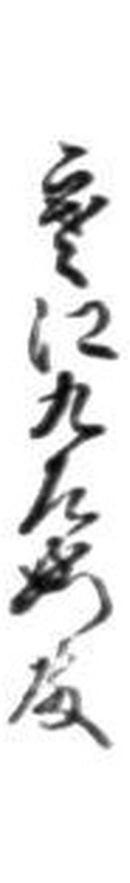寒江九左衛門殿

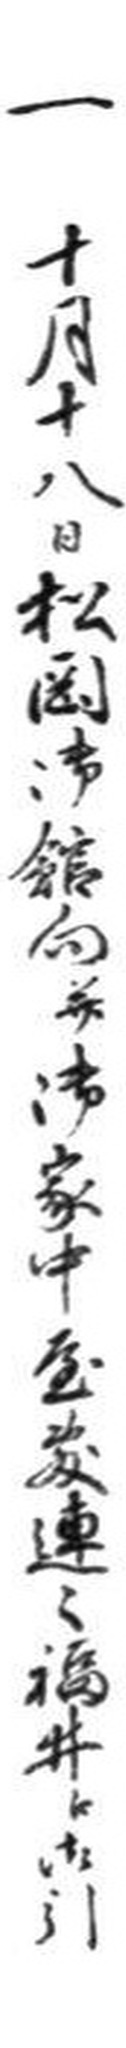一十月十八日松岡御館向幷御家中屋敷連々福井江御引
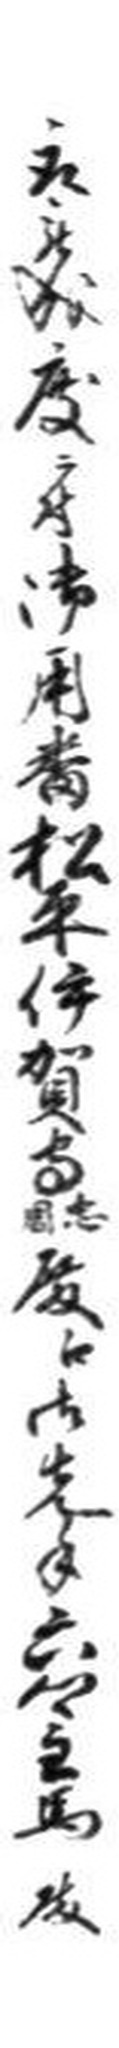取被成度ニ付御用番松平伊賀守忠周殿江御先手六郷主馬殿
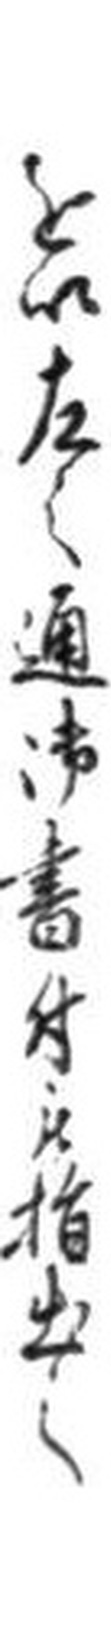を以左之通御書付被指出之
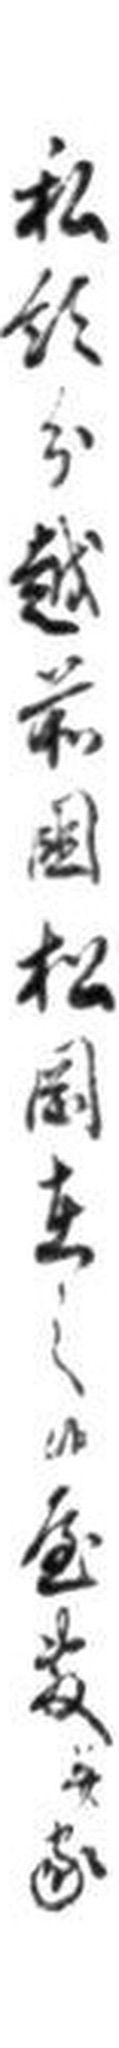私領分越前国松岡在之候屋敷幷家
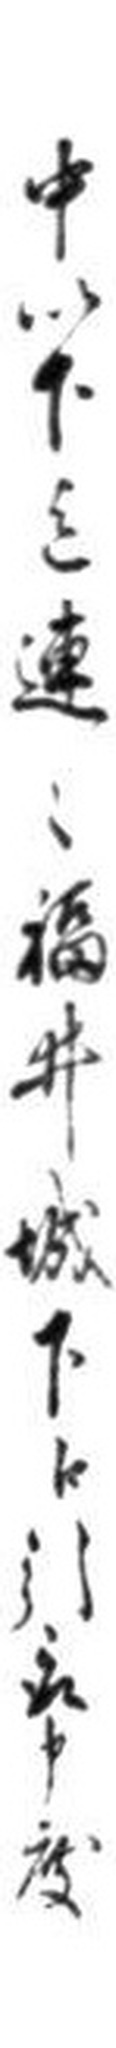中以下迄連々福井城下江引取申度
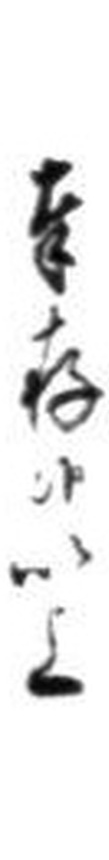奉存候以上
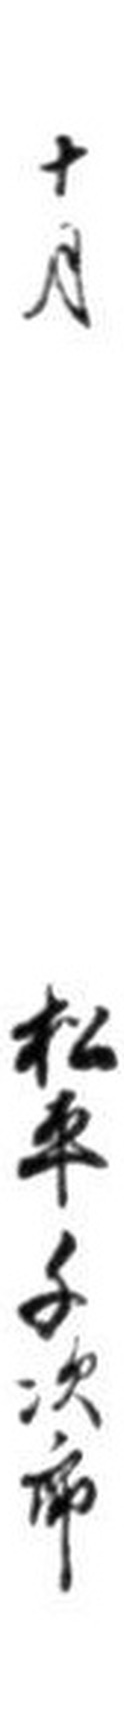十月松平千次郎
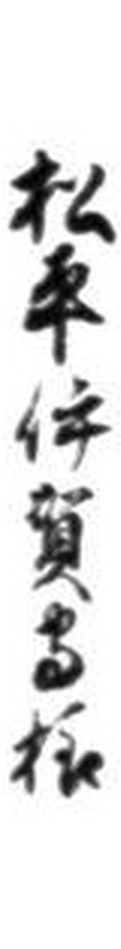松平伊賀守様
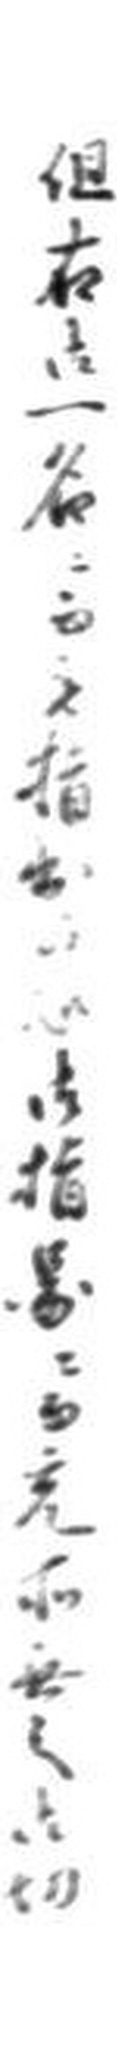但右御一名ニ而被指出候処御指図ニ而充所無之御切
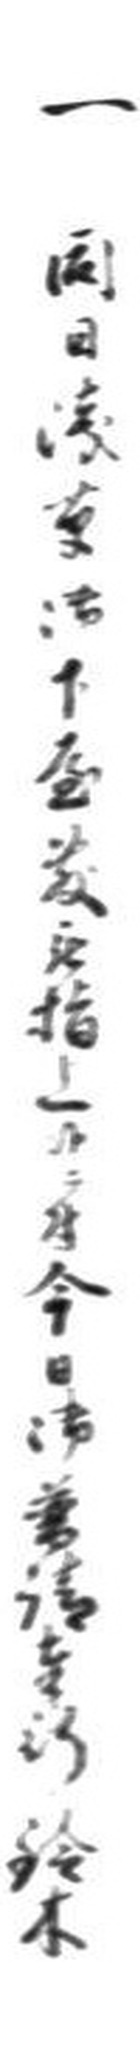一同日浅草御下屋敷被指上候ニ付今日御普請奉行鈴木
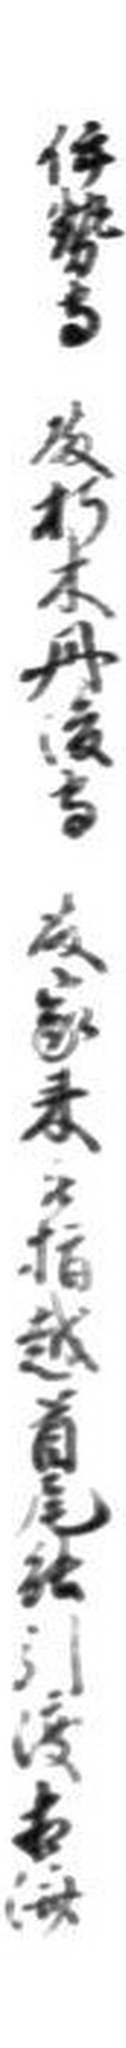伊勢守殿朽木丹後守殿家来被指越首尾能引渡相済
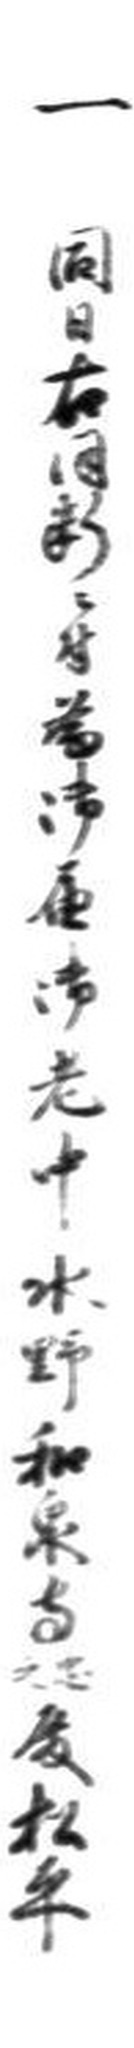一同日右同断ニ付為御届御老中水野和泉守忠之殿松平
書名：家譜 三十九 宗矩公 享保十年
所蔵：福井県文書館 Fukui Prefectural Archives
